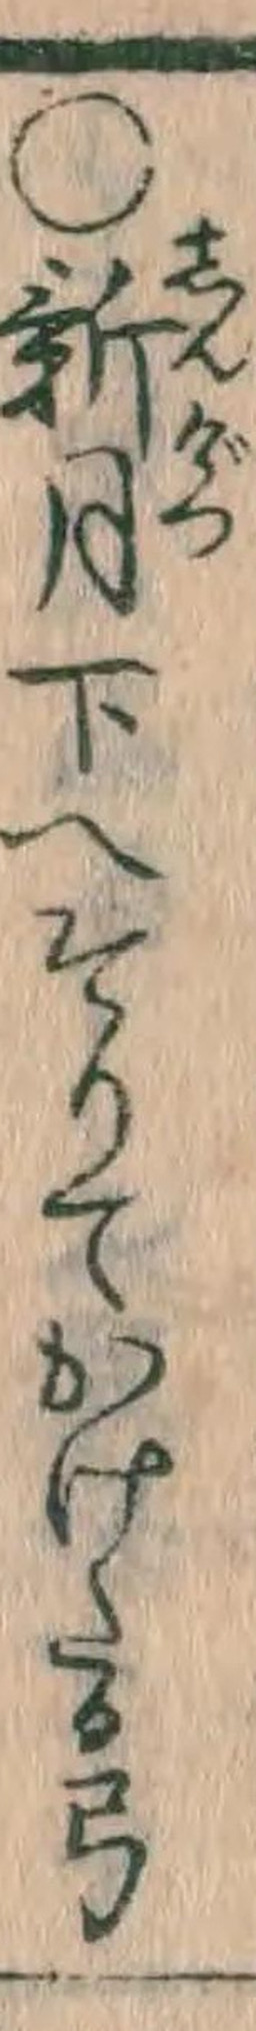○新月下へそりてかけたる弓
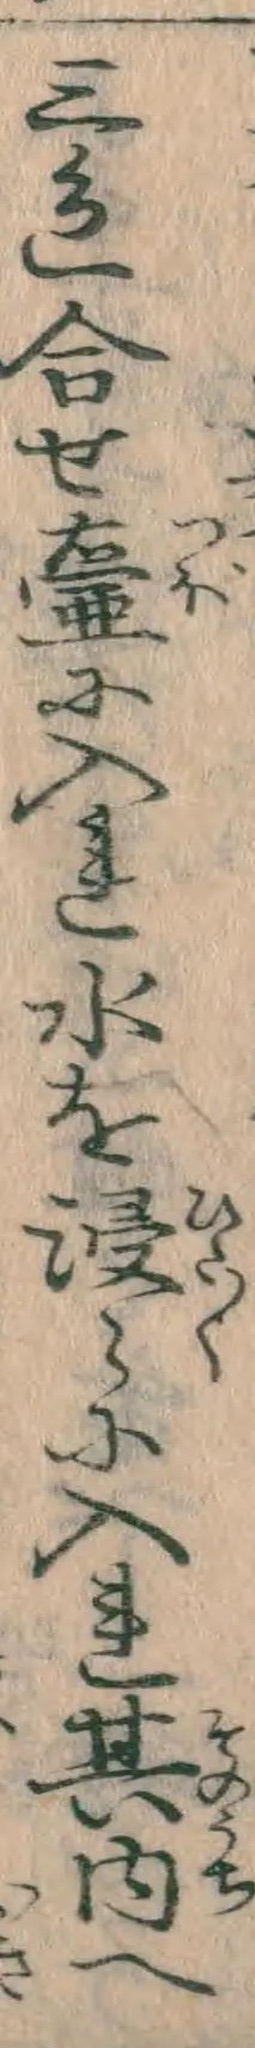三色合せ壷に入れ水を浸々に入れ其内へ
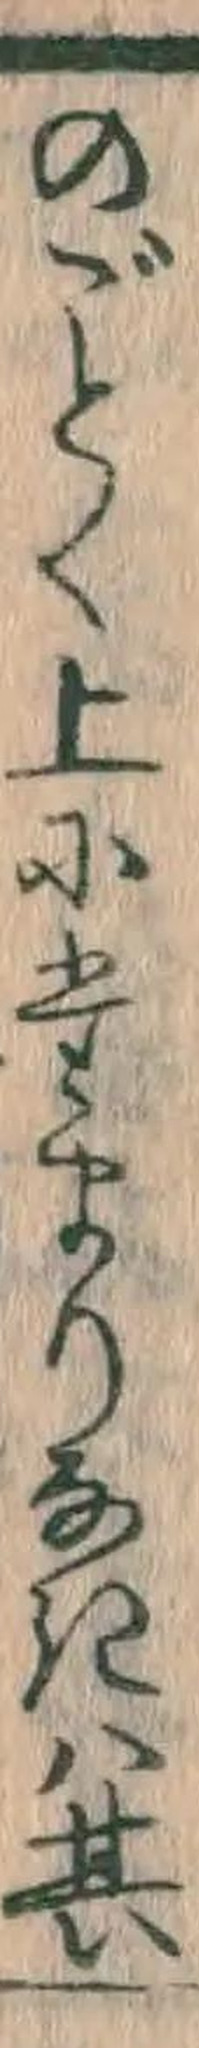のごとく上にたまりなきは其
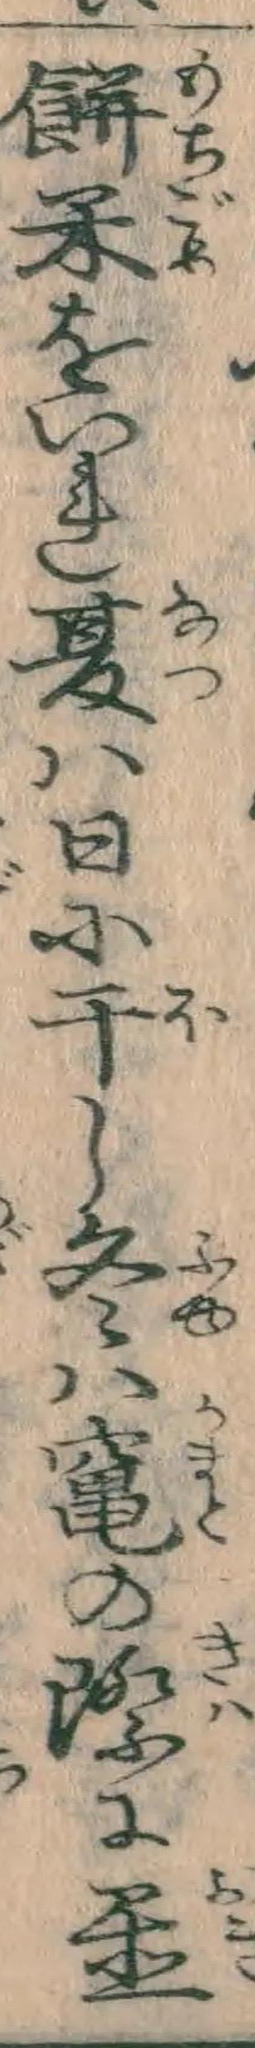餅米をいれ夏は日に干し冬は竈の際に置
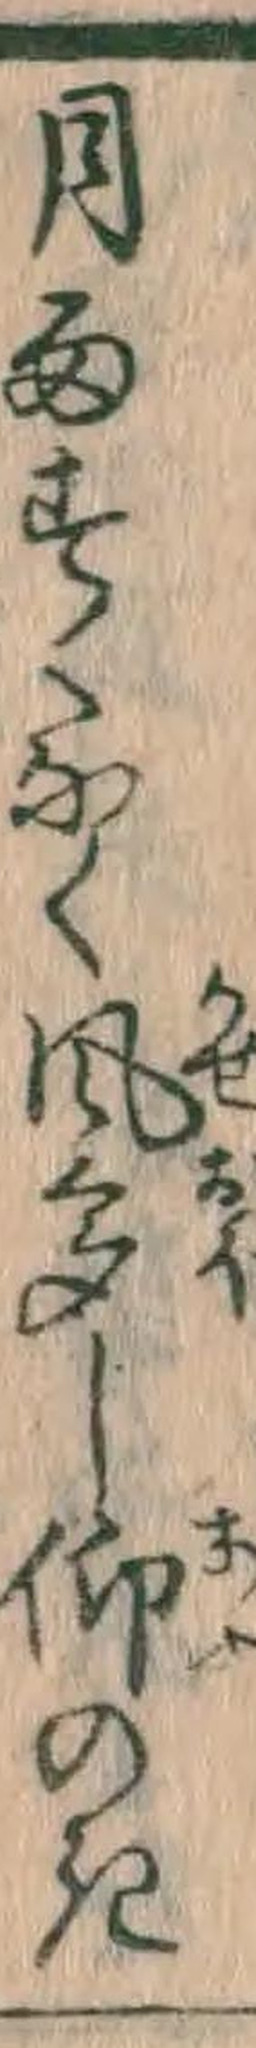月雨すくなくかぜ風多し仰のき
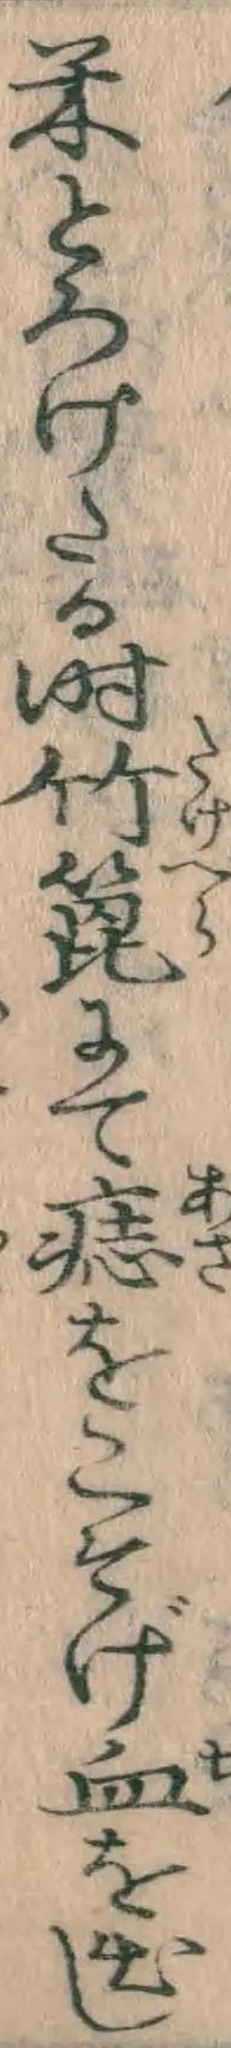米とろけたる時竹箆にて痣をこそげ血を出し
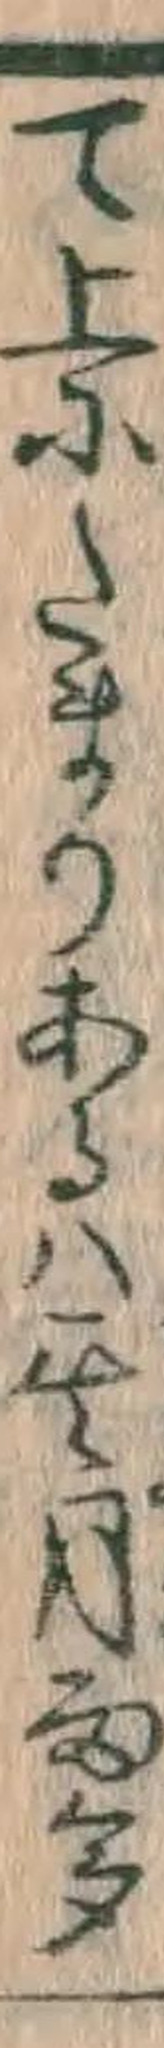て上にたまりあるは其月雨多
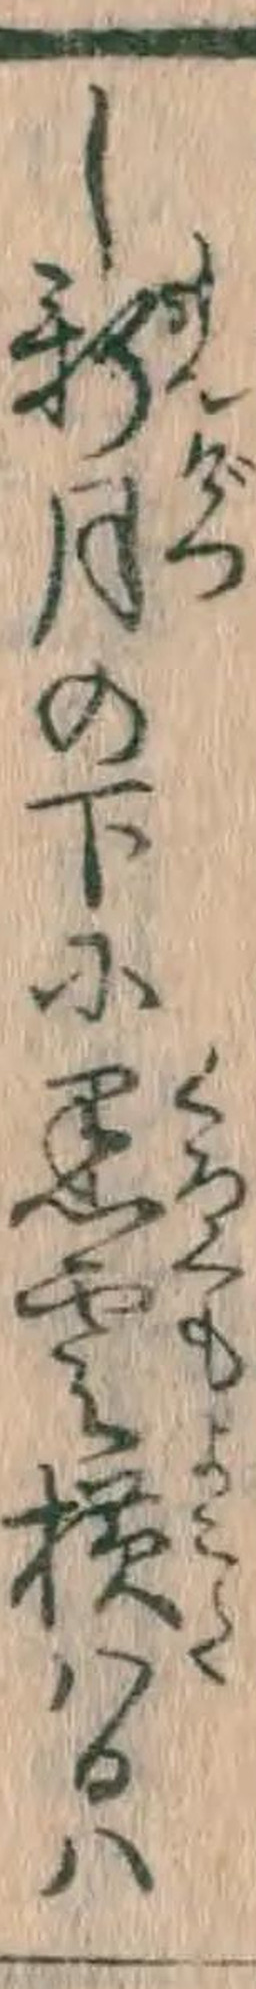し新月の下に黒雲横はるは
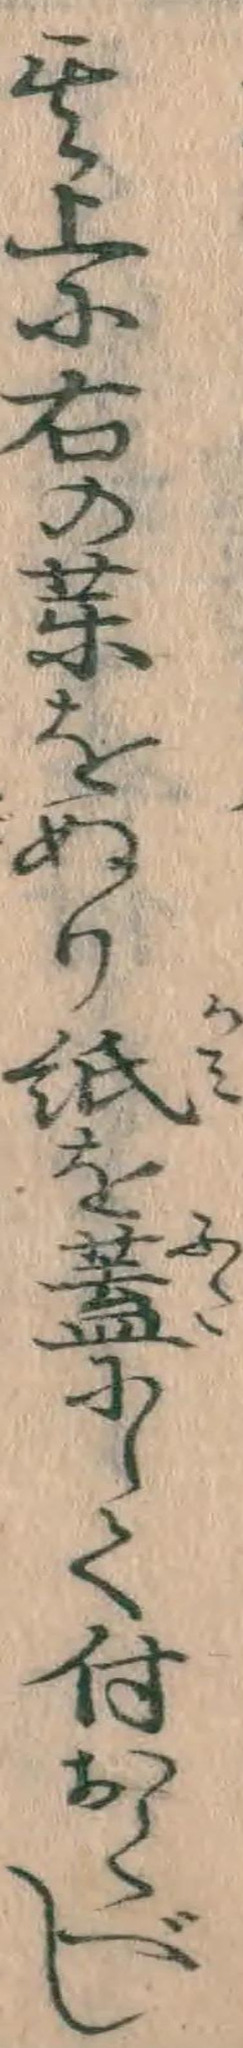其上に右の薬をぬり紙を蓋にして付おくべし
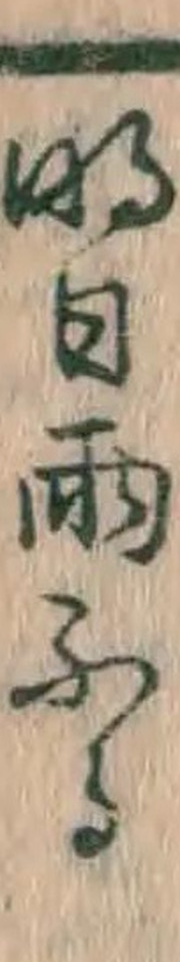明日雨ふる
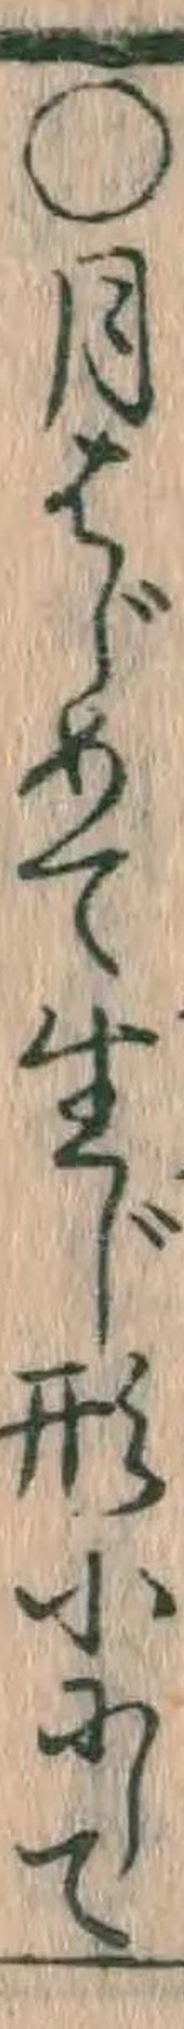○月はじめて生じ形小にして
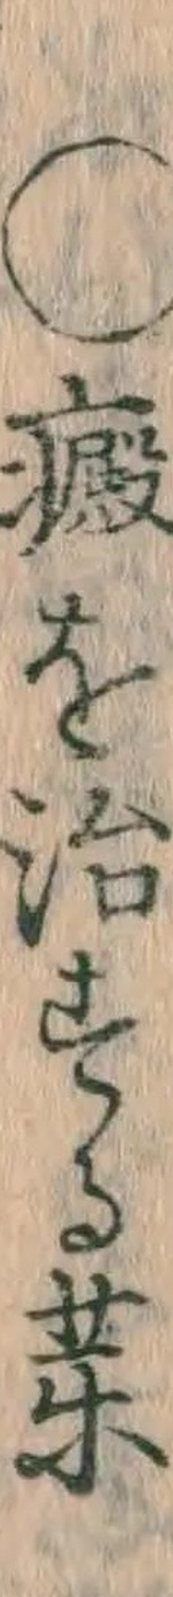○癜を治する薬
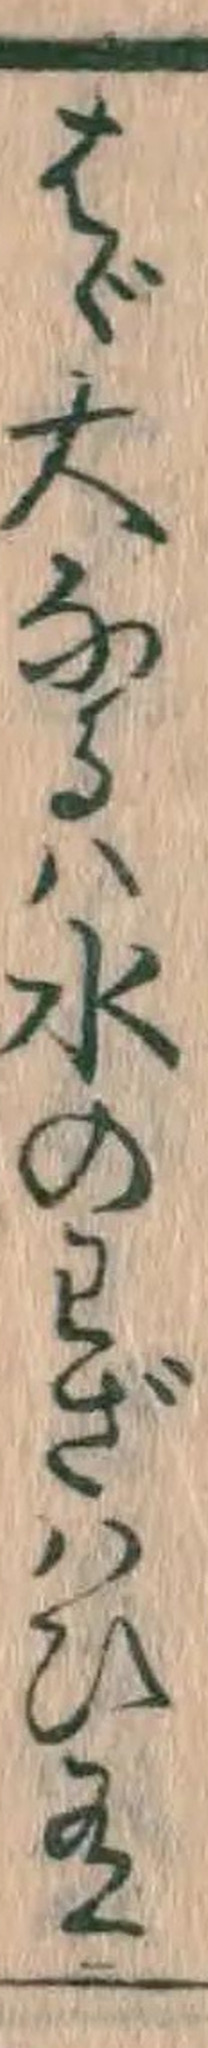はゞ大なるは水のわざはひ有
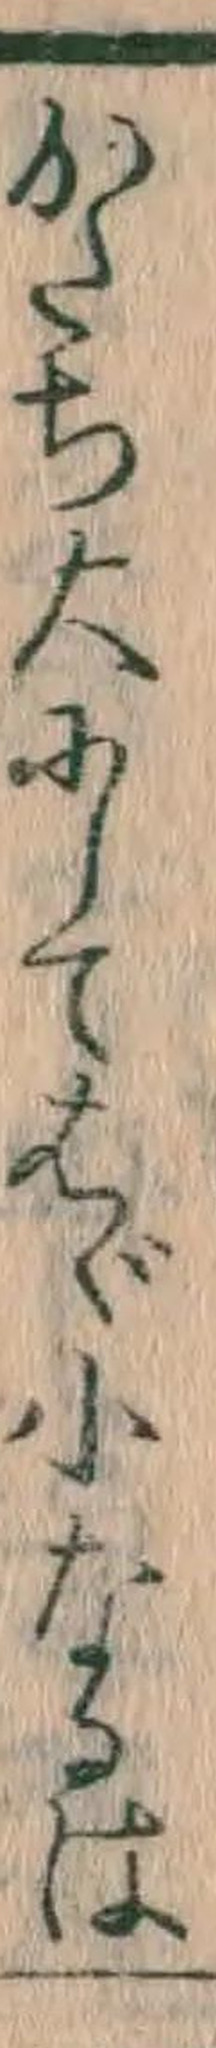かたち大にしてはゞ小なるは
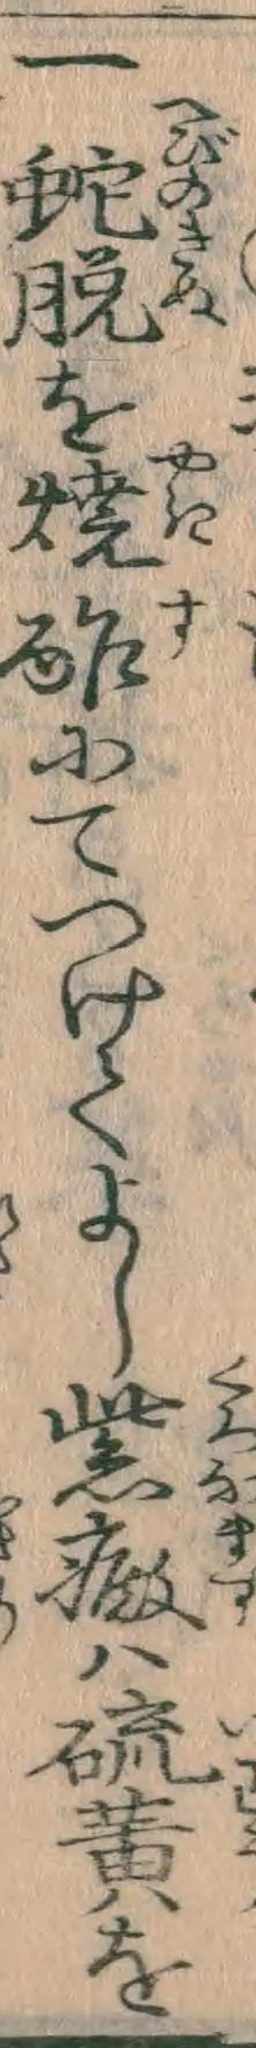一蛇脱を焼酢にてつけてよし紫癜は硫黄を
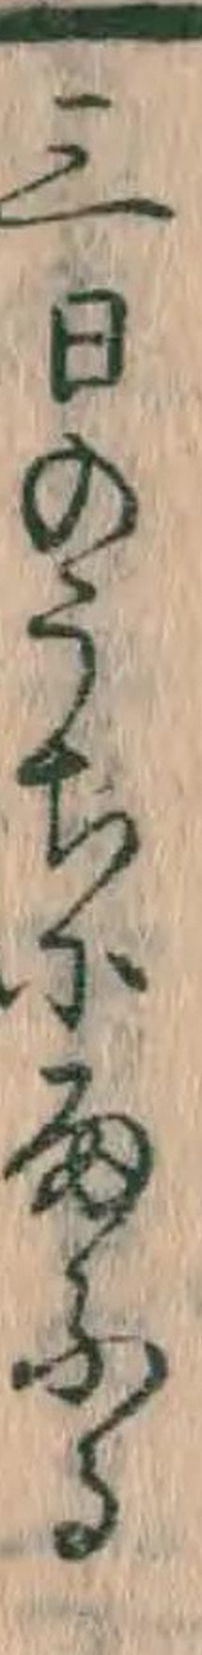三日のうちに雨ふる
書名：広益秘事大全 3巻. [3]
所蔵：国立国会図書館 National Diet Library, JAPAN
